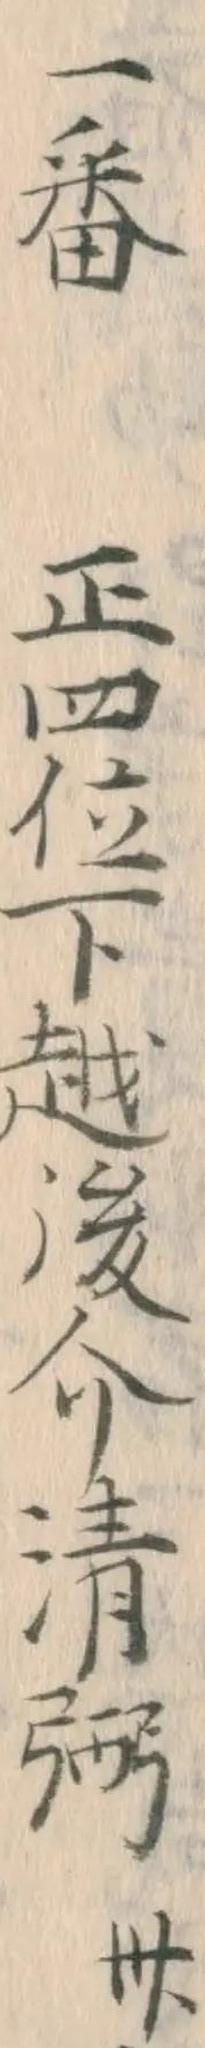一番正四位下越後介清弼卅七才

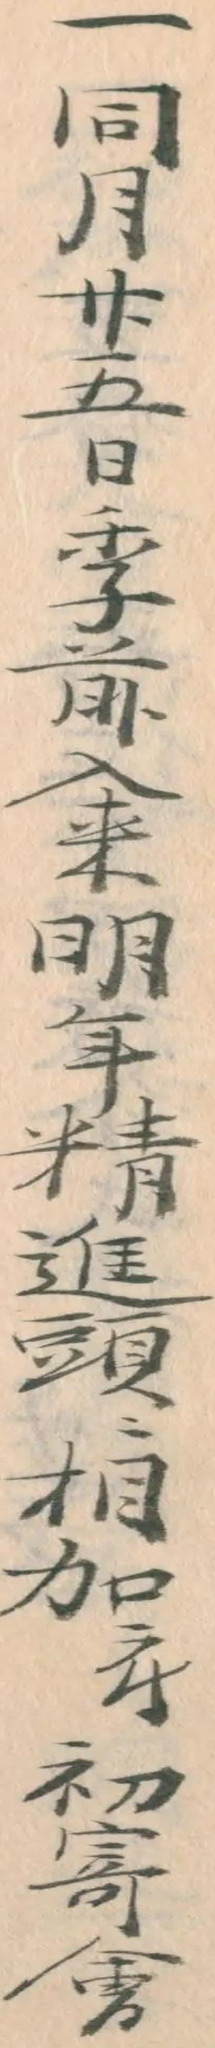一同月廿五日季前入来明年精進頭ニ相加ニ付初寄會
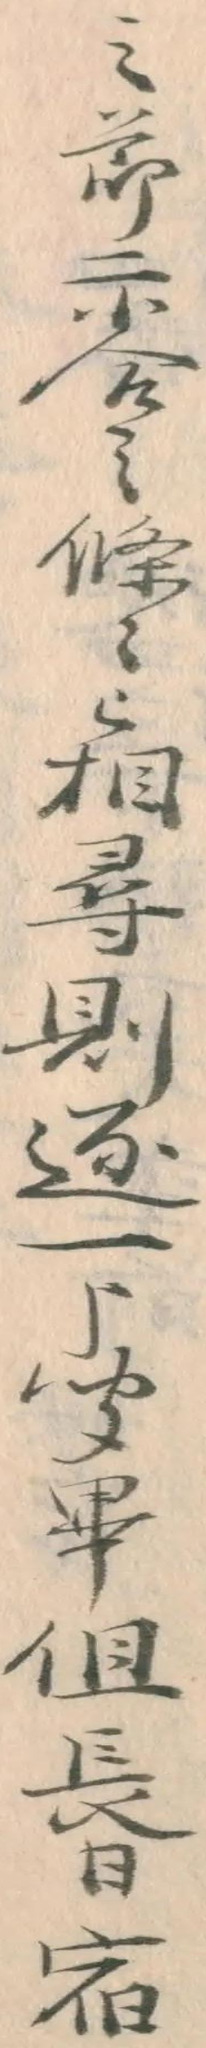之節示合之條々被相尋則逐一申聞畢但長日宿
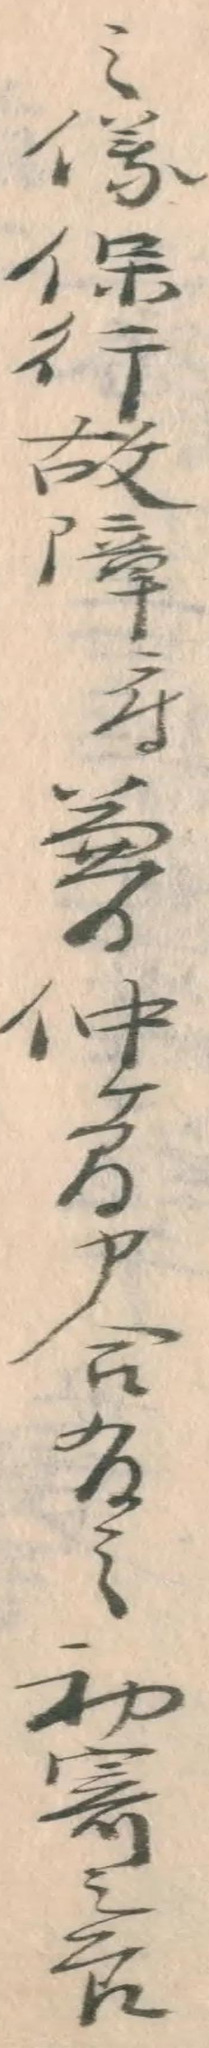之儀保行故障ニ付兼日仲ヶ間申合有之初寄之節
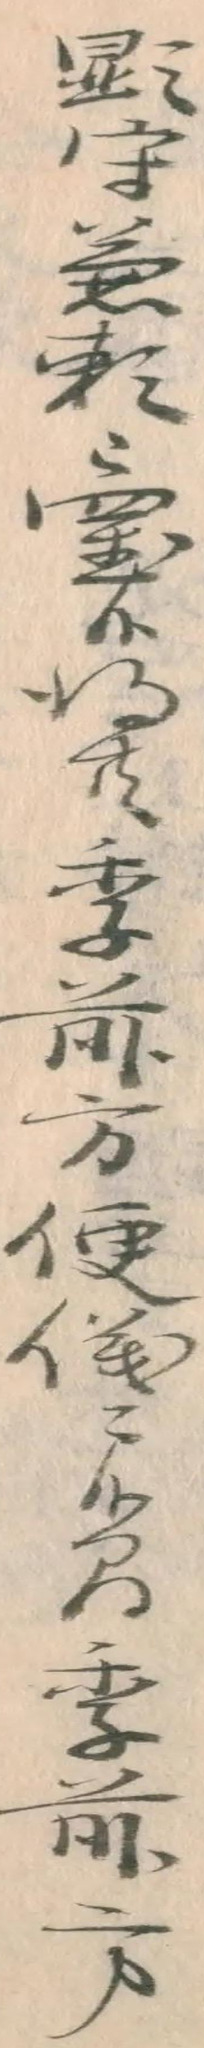顕守兼頼被置候得共季前方便儀ニ候間季前方
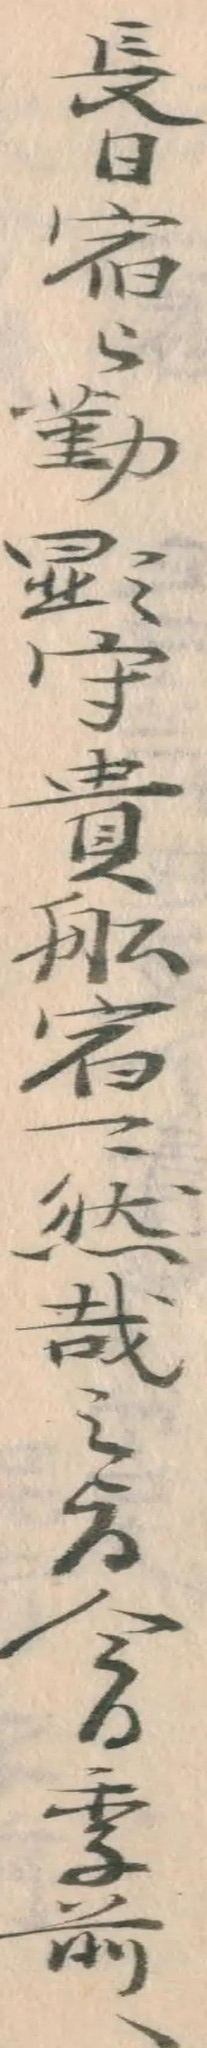長日宿被勤顕守貴舩宿可然哉之旨今日季前へ
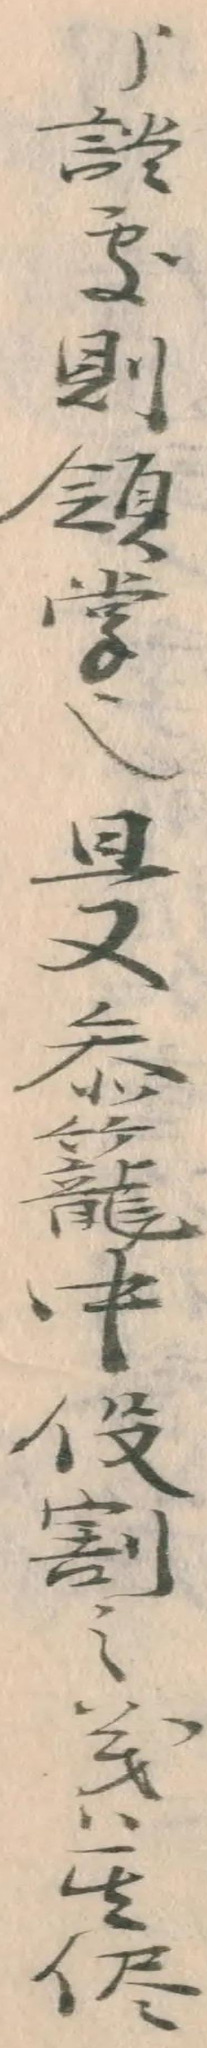申談處則領掌也且又参籠中役割之義ハ其儘
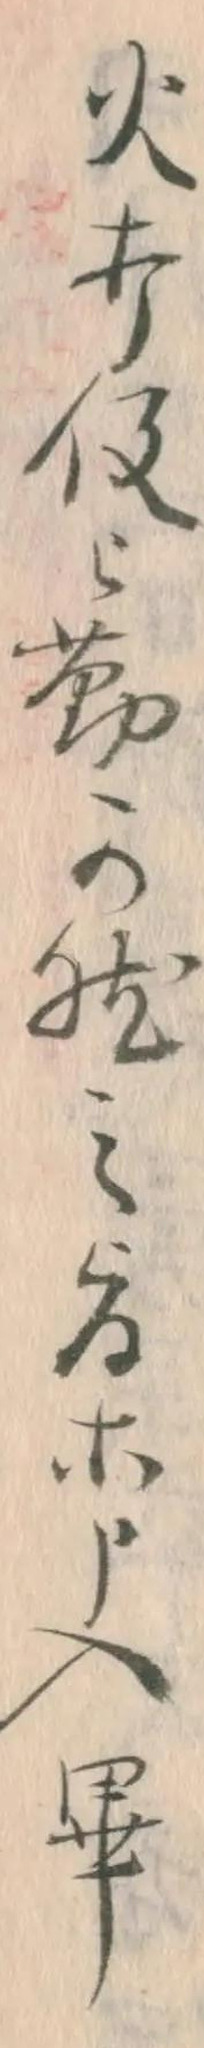火打役被勤可然之旨等申入畢
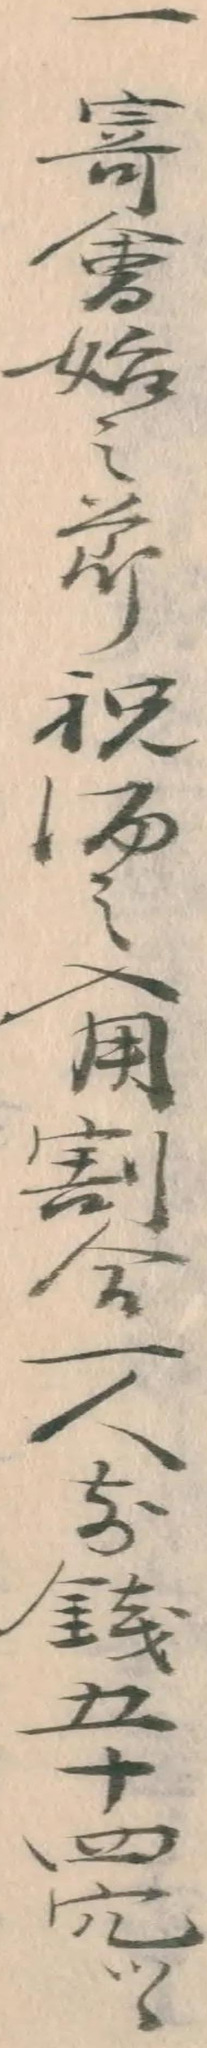一寄會始之節祝酒之入用割合一人前銭五十四穴ツヽ
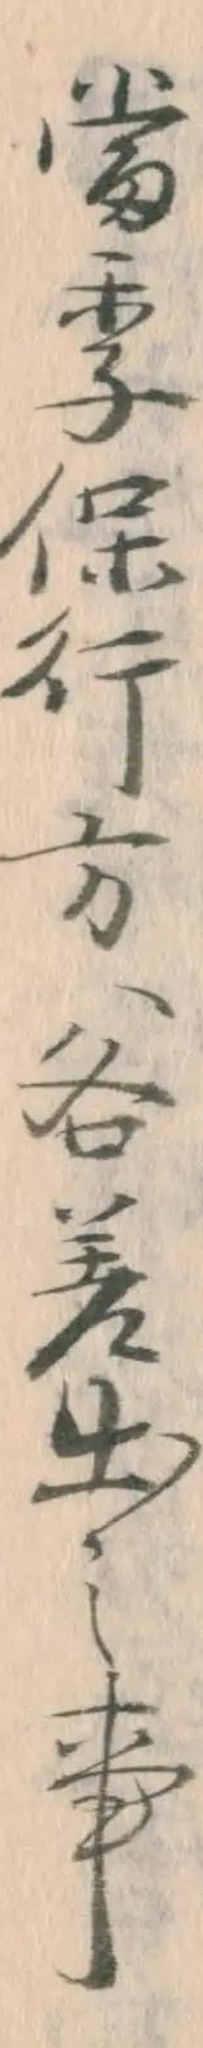當季保行方へ各差出之事
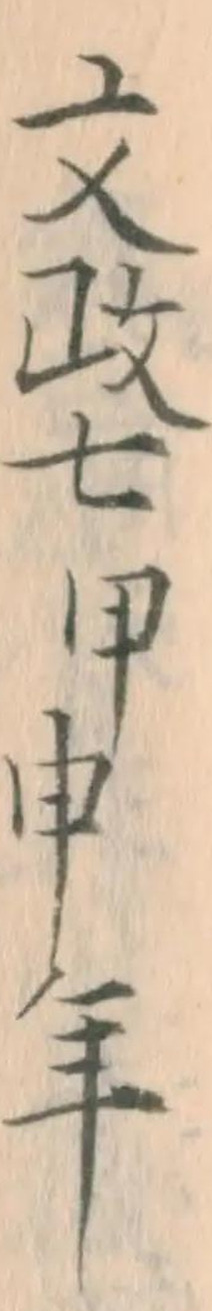文政七甲申年
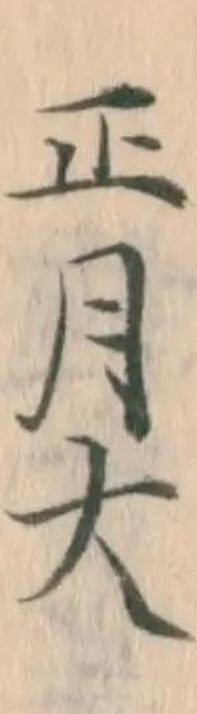正月大
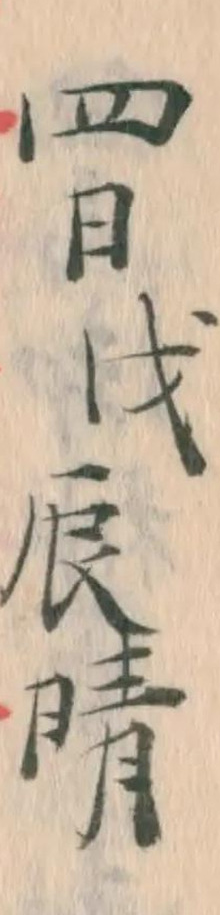四日戊辰晴
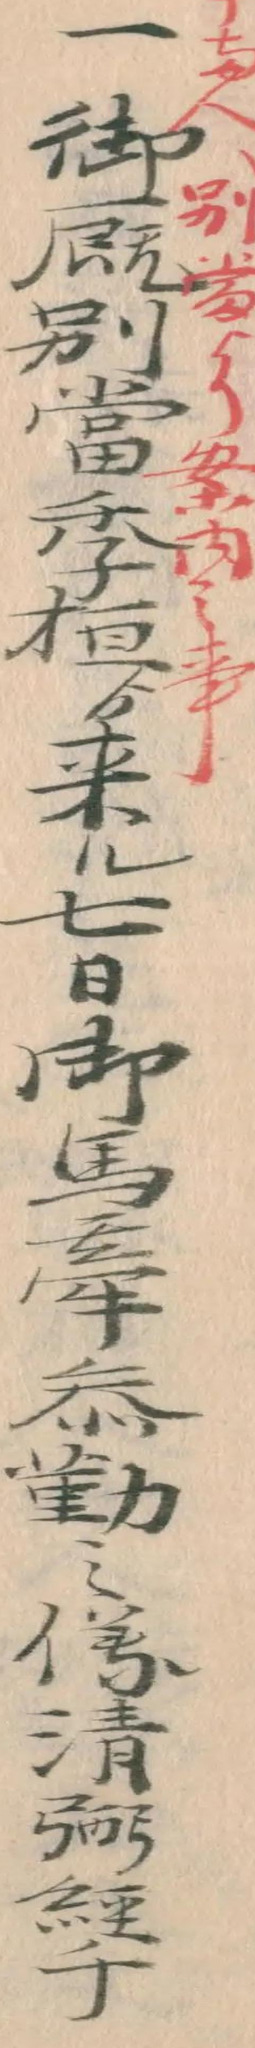一御厩別當季桓ゟ来ル七日御馬牽参勤之儀清弼経千
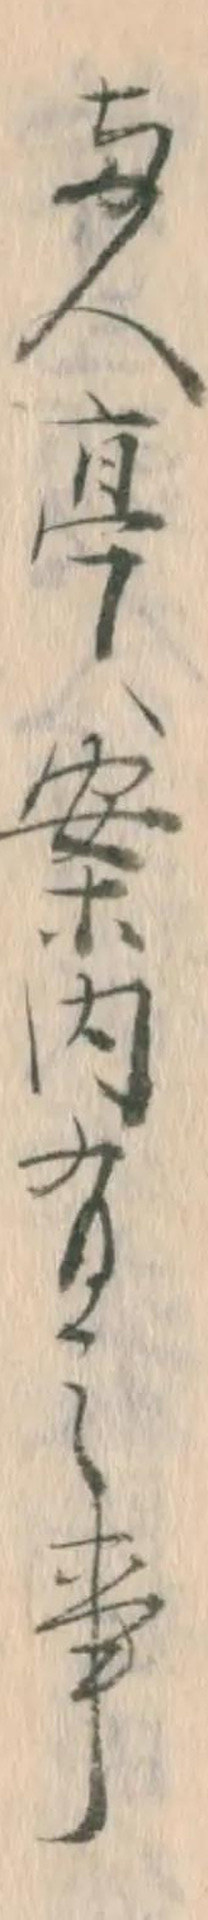両人亭へ案内有之事
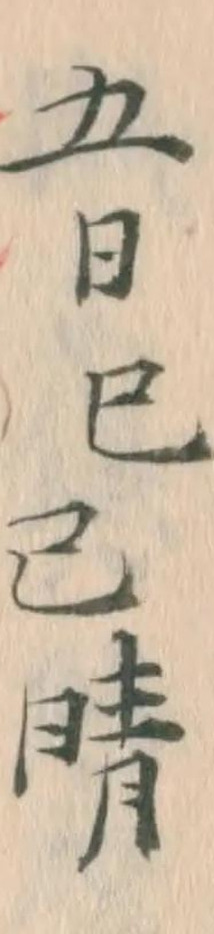五日己巳晴
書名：賀茂社記録. 第72冊
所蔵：国立国会図書館 National Diet Library, JAPAN
